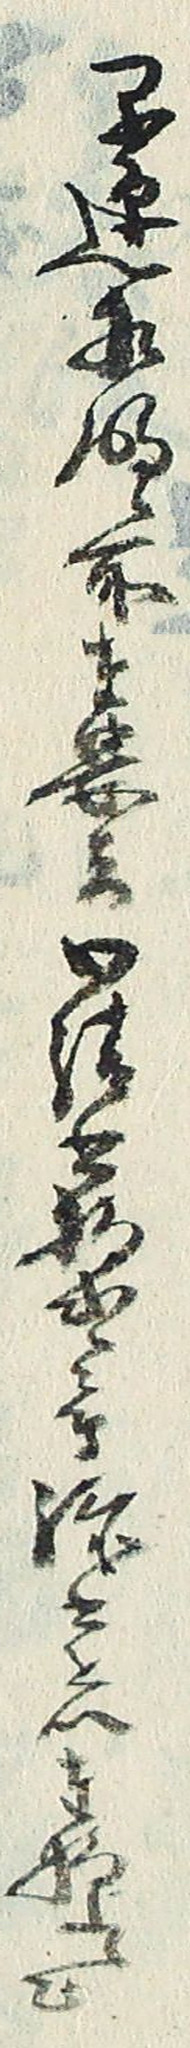早速相触候所奉畏旨御請書指出候に付添書を以奉指上候以上
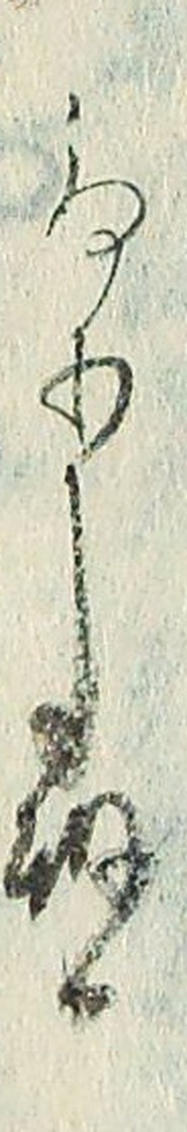卯五月朔日
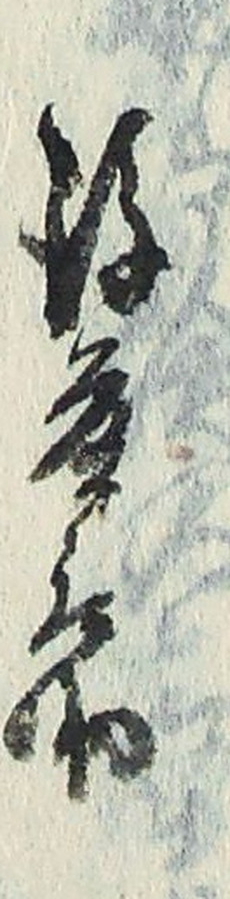後藤庄助
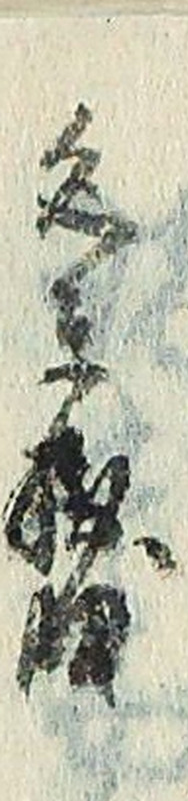名東勝浦
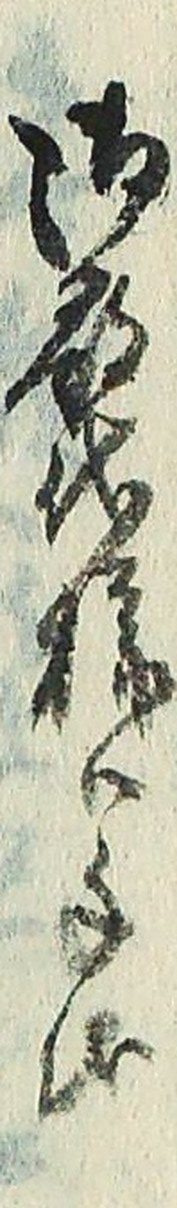御郡代様御手代
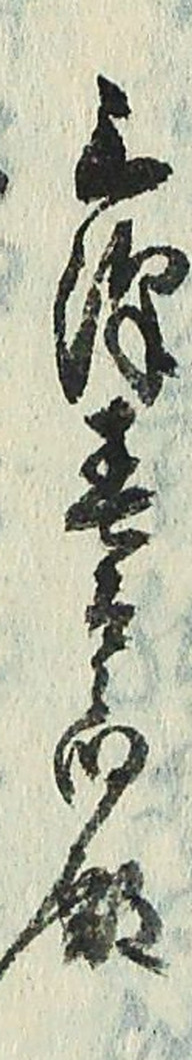三沢春太郎殿
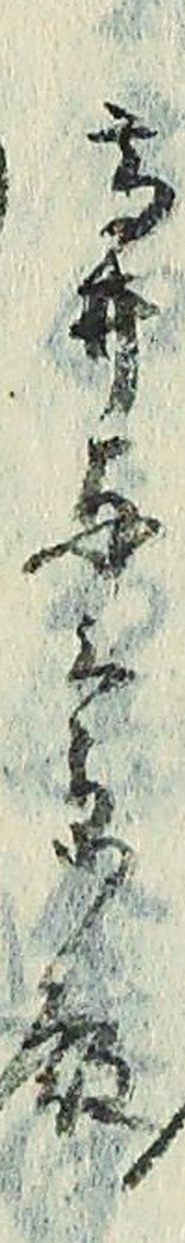高井与三兵衛殿
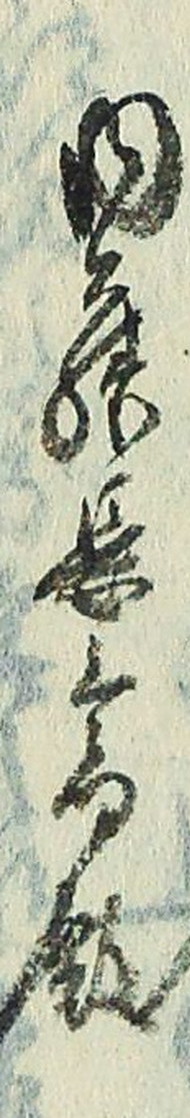内藤長三郎殿
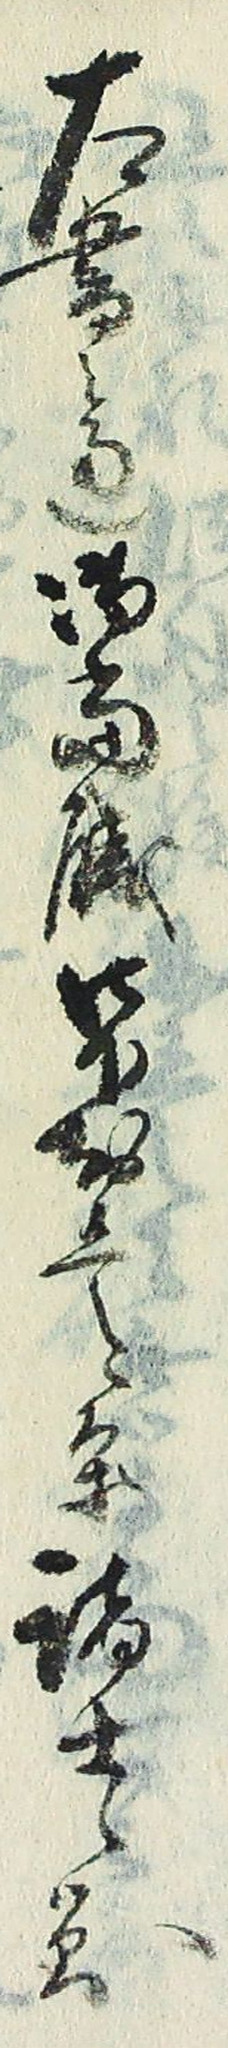左書之通御当職御下知有之候条諸士へ対
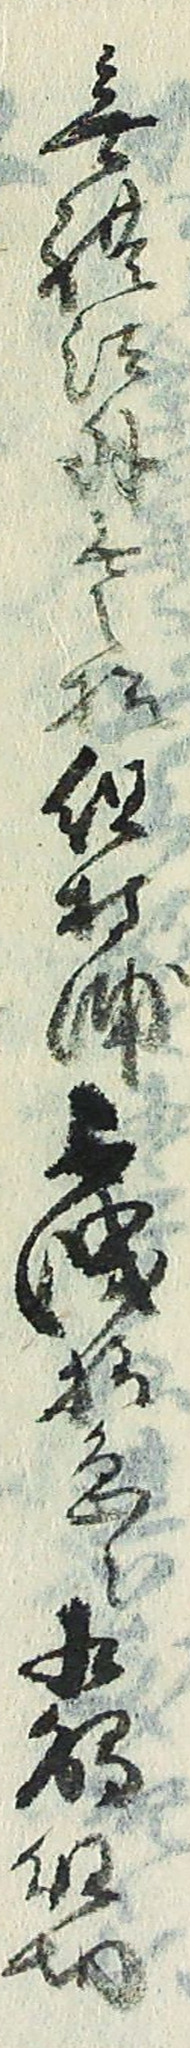無礼法外無之様組村浦不洩様急々相触組切
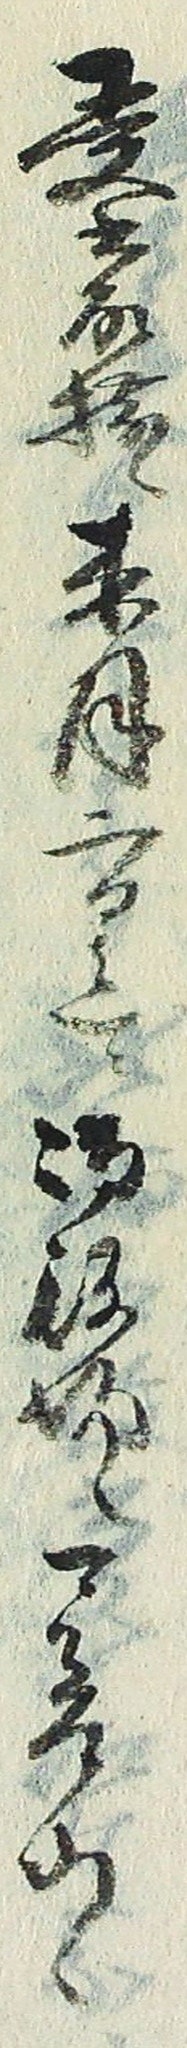御受書取揃へ来月二日迄に御役場へ可差出候
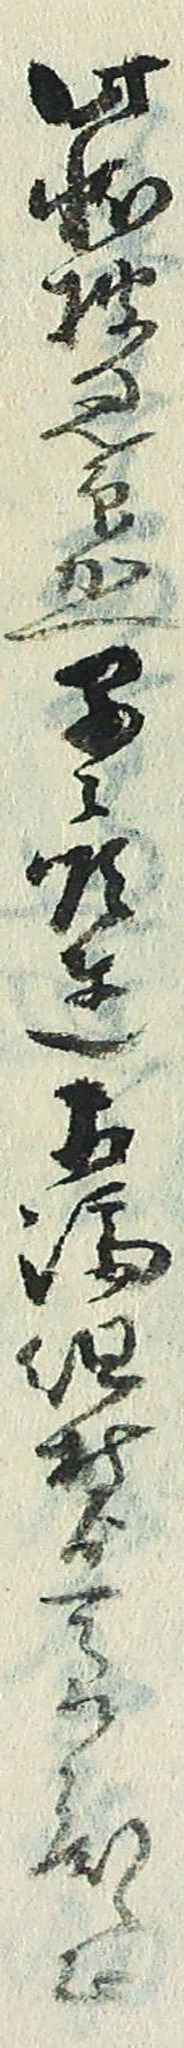此状披見印加へ早々順達相済組村ゟ可差戻候以上
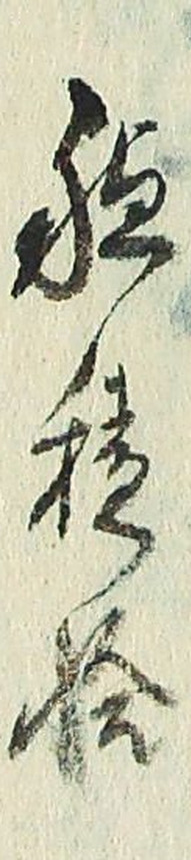穂積恰
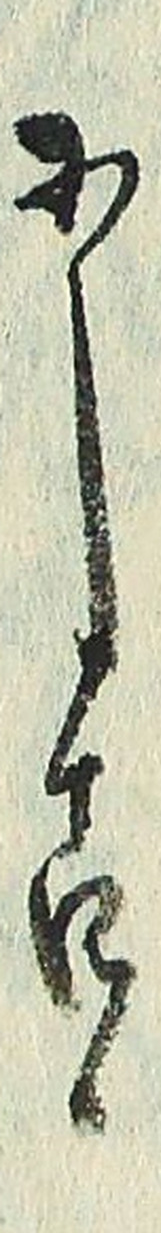五月十四日
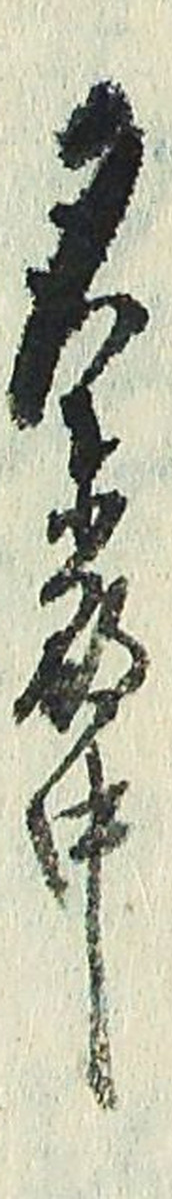名東郡中
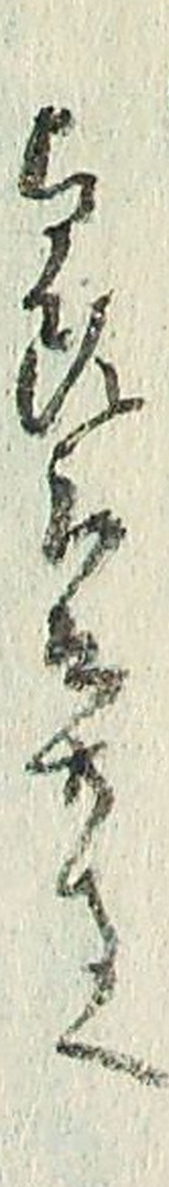与頭庄屋共方へ
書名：諸御用御□受書控
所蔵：鳴門教育大学 Naruto University of Education
